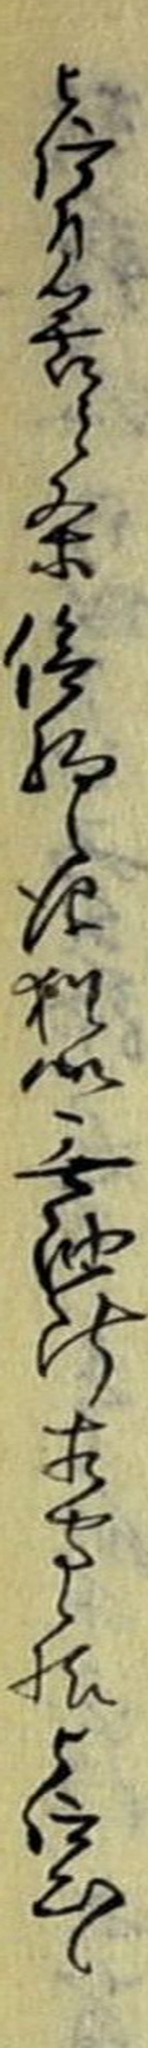被仰付筈之条倹約之儀猶以無由断相守候様被仰出候
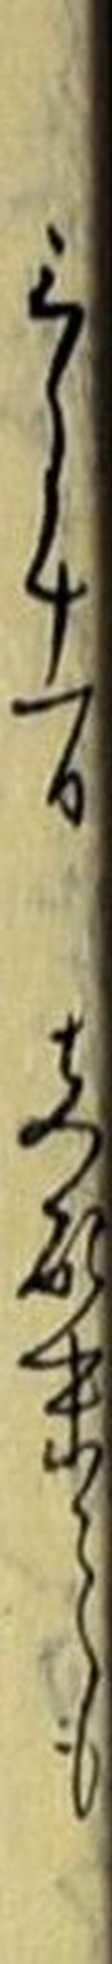三月十一日支配末々へも
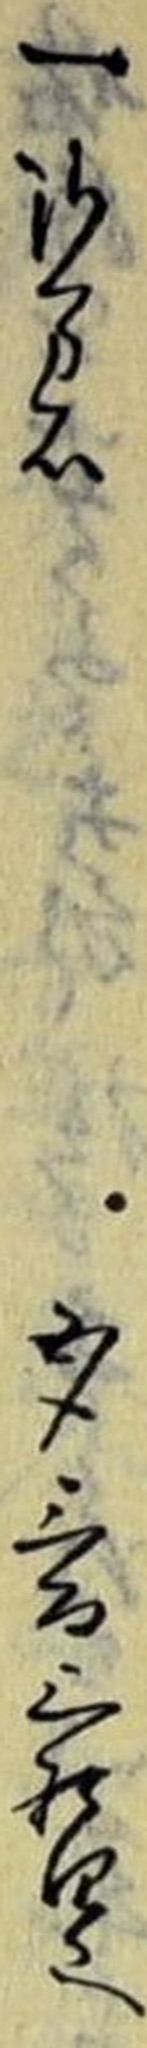一弐万石五貫三百三拾四匁
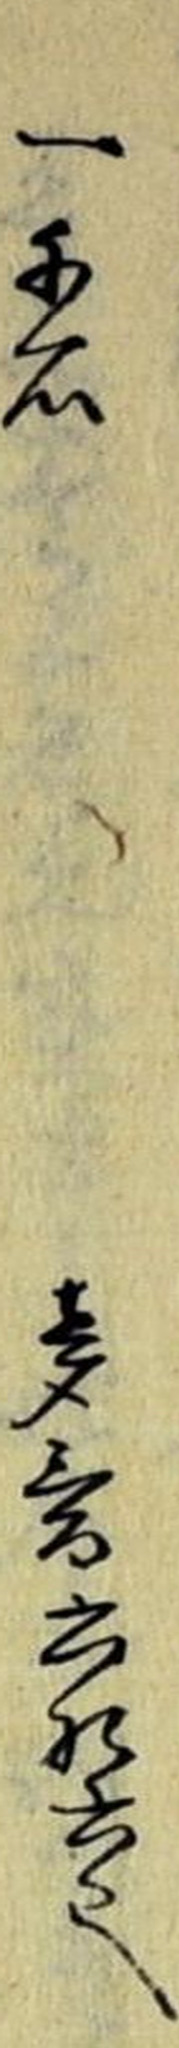一千石壱貫三百六拾六匁
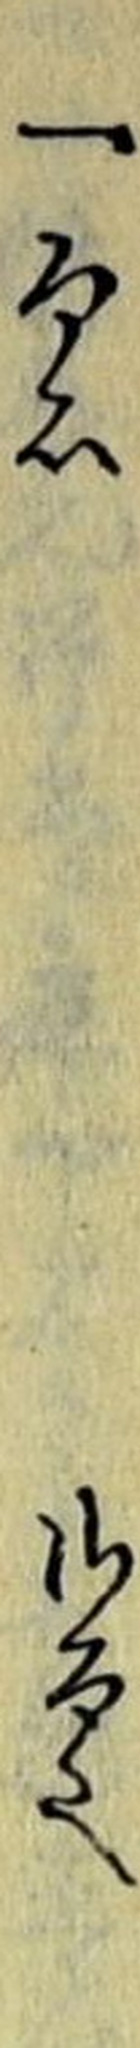一百石弐百匁
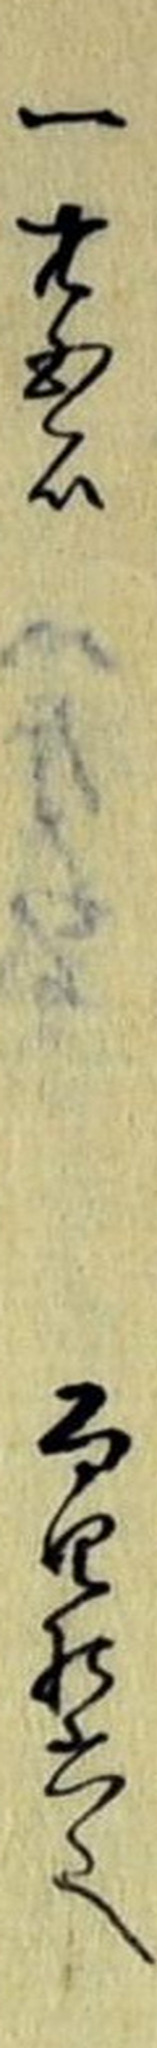一廿五石百四拾六匁
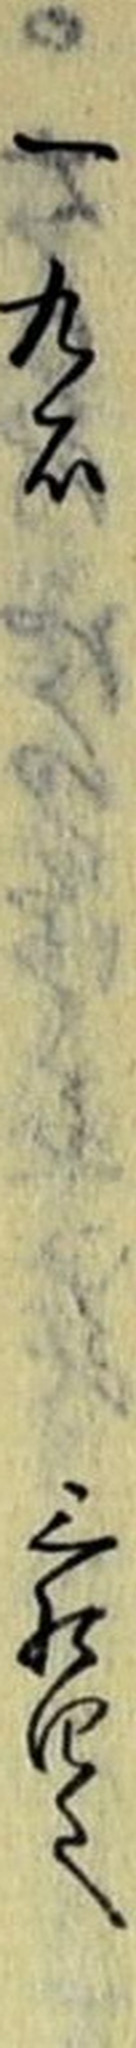一九石三拾四匁
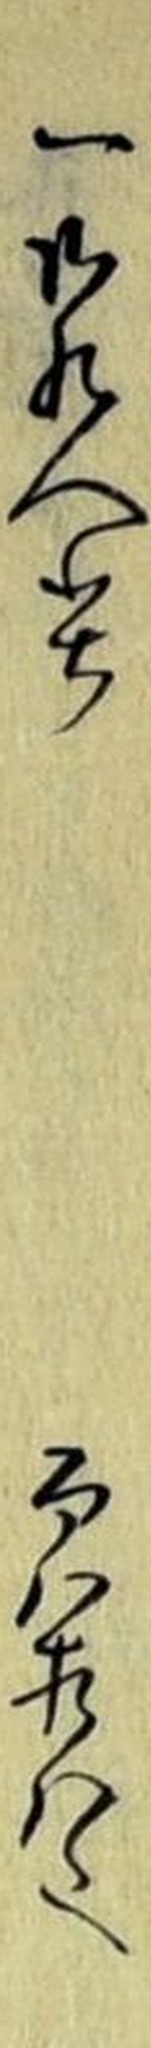一弐拾人ふち百八拾八匁
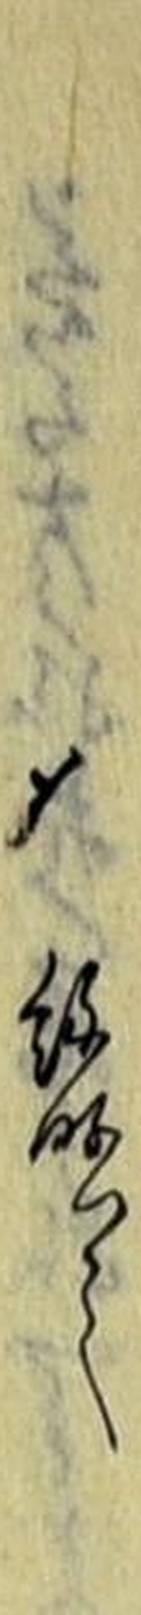〆餘略之
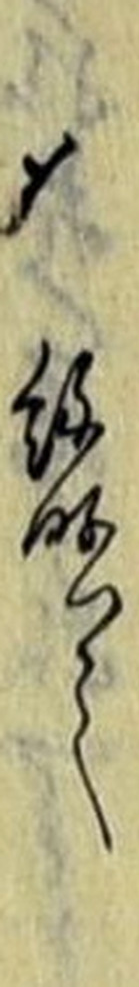〆餘略之
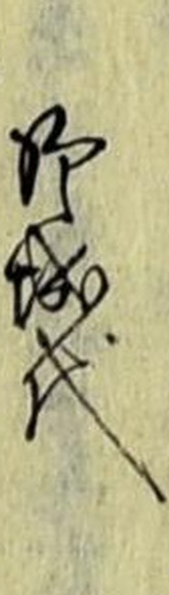御城代
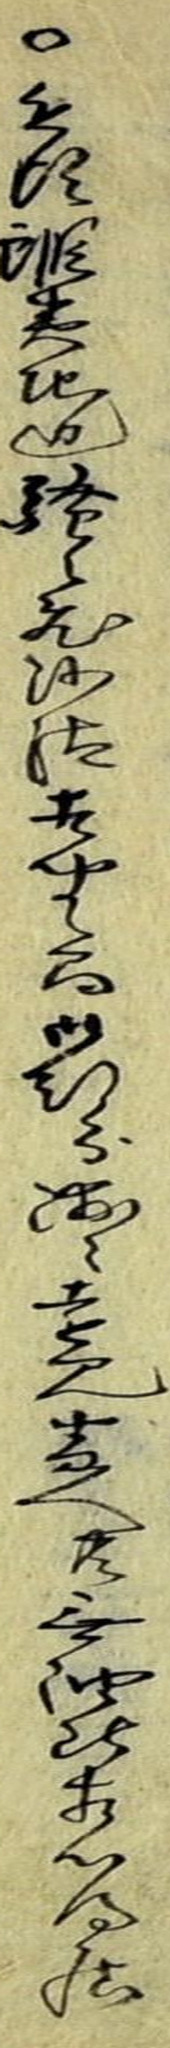○近頃蝦夷地辺騒々敷沙汰相聞候間御領分浦々遠見番人共無由断相心得居
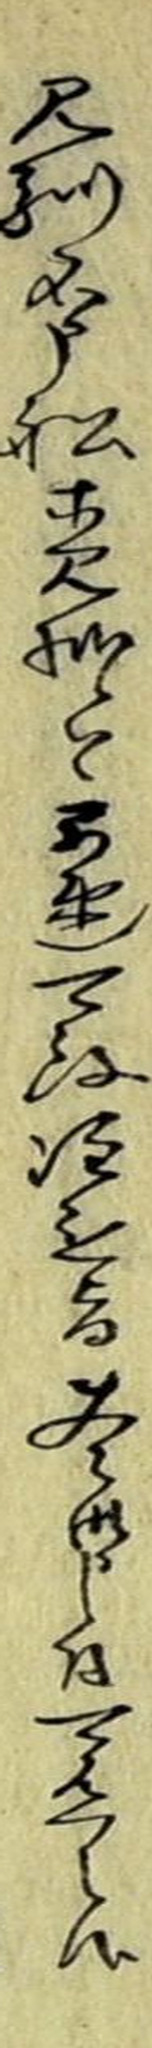見馴不申船等見掛候はヽ早速可致注進旨夫々御申付可有之候
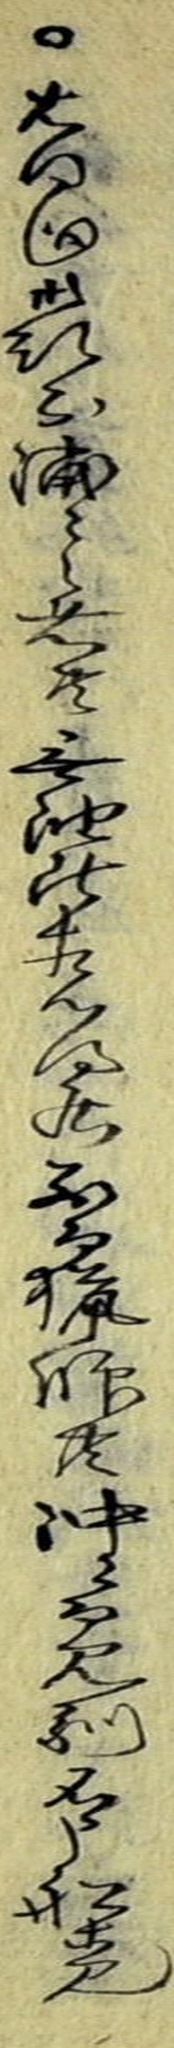○右同趣御領分浦々之者共無由断相心得居別而猟師共沖に而見馴不申船等見
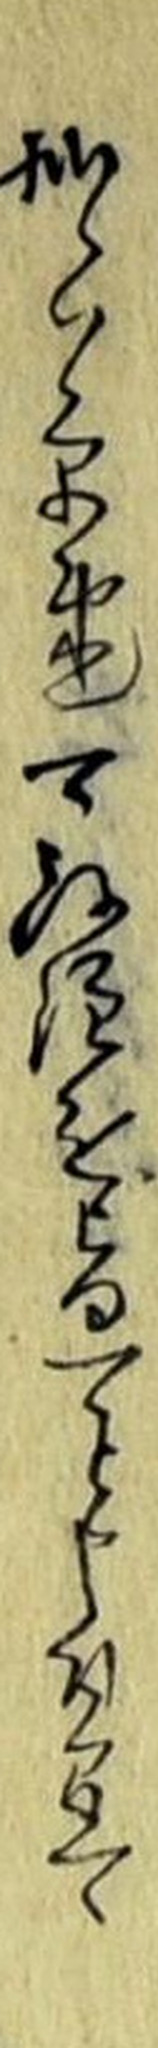掛候はヽ早速可致注進旨可被申付置候
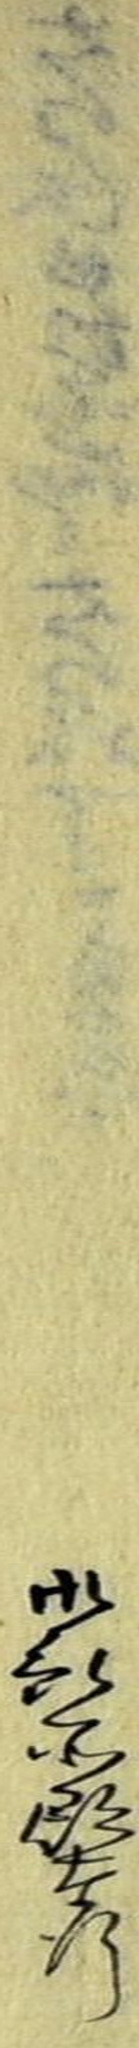御預所郡奉行
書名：命令之部 四
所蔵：福井県文書館 Fukui Prefectural Archives
